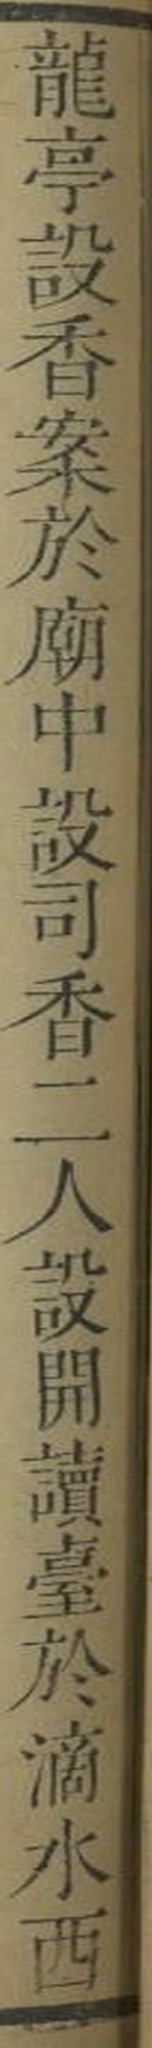龍亭設香案於廟中設司香二人設開讀臺於滴水西
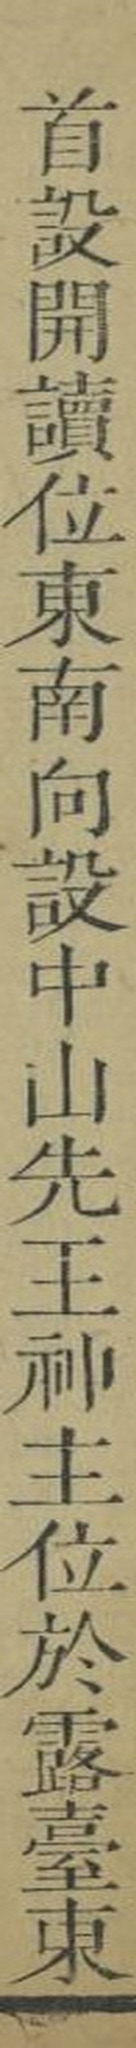首設開讀位東南向設中山先王神主位於露臺東
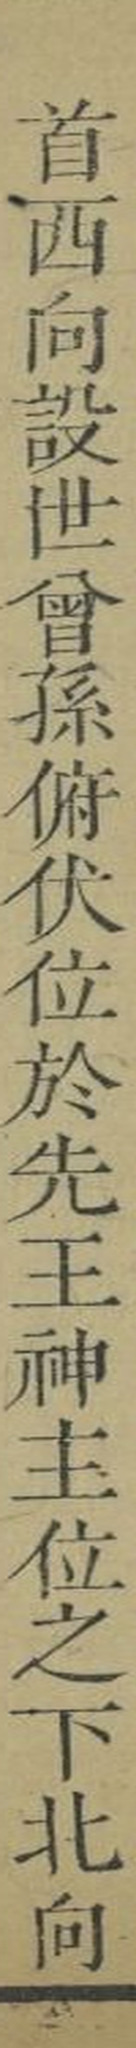首西向設世曾孫俯伏位於先王神主位之下北向
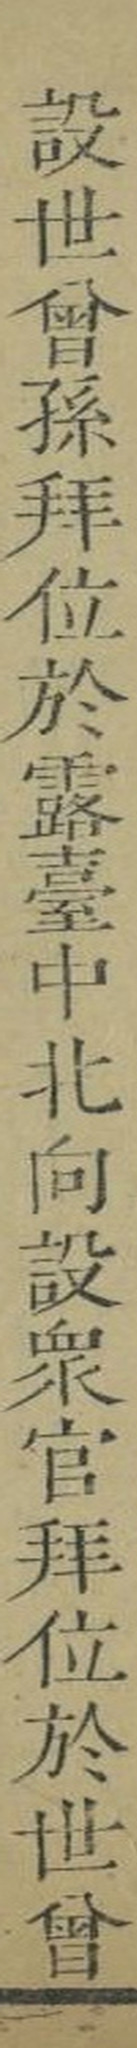設世曾孫拜位於露臺中北向設衆官拜位於世曾
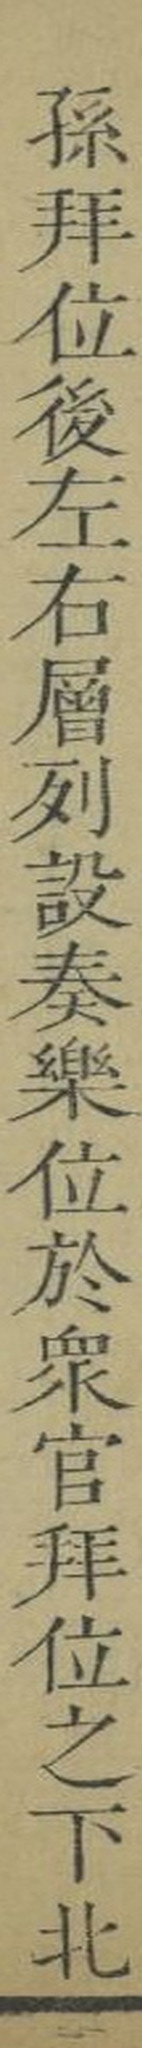孫拜位後左右層列設奏樂位於衆官拜位之下北
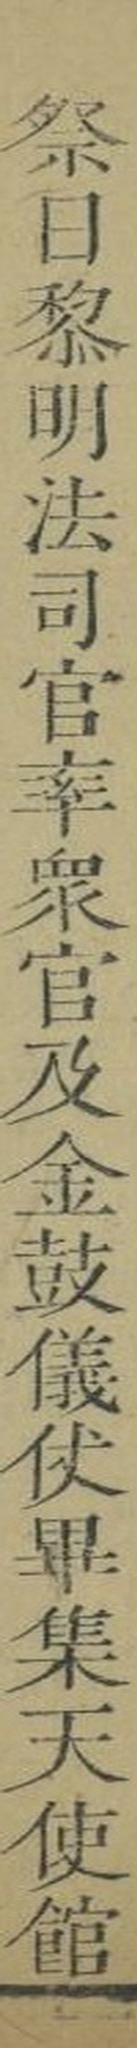祭日黎明法司官率衆官及金鼓儀仗畢集天使館
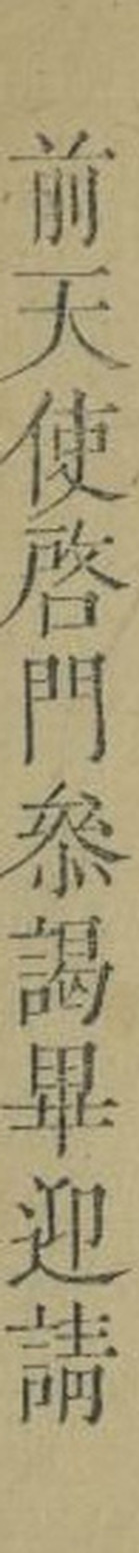前天使啓門叅謁畢迎請
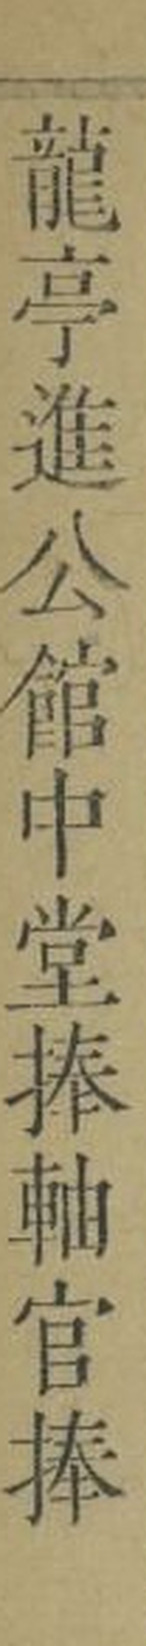龍亭進公館中堂捧軸官捧

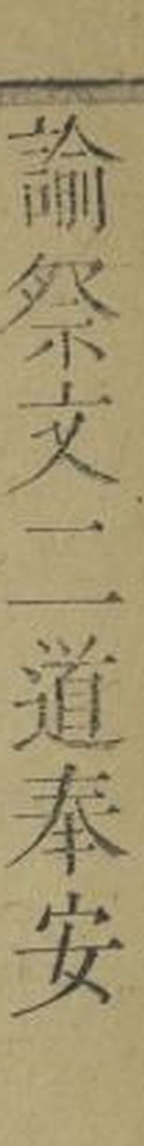諭祭文二道奉安
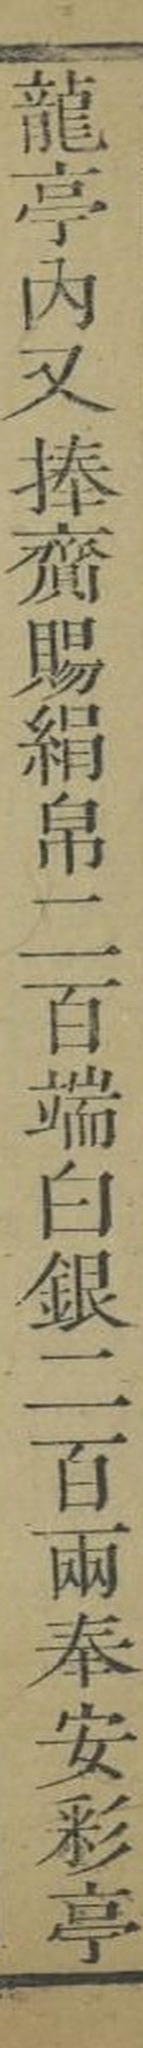龍亭内又捧齎賜絹帛二百端白銀二百兩奉安彩亭
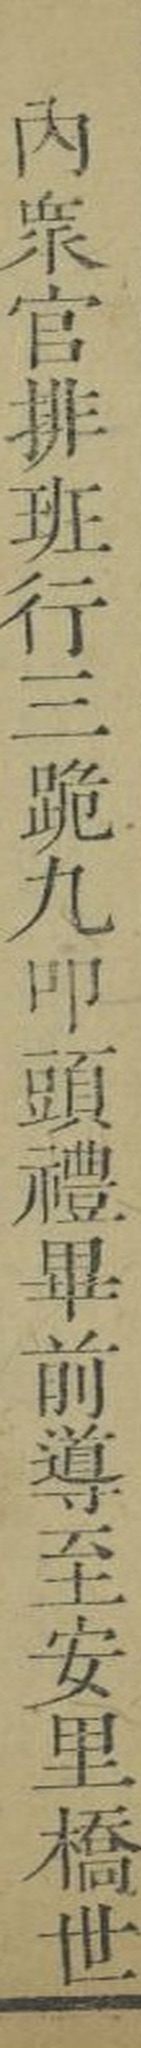内衆官排班行三跪九叩頭禮畢前導至安里橋世
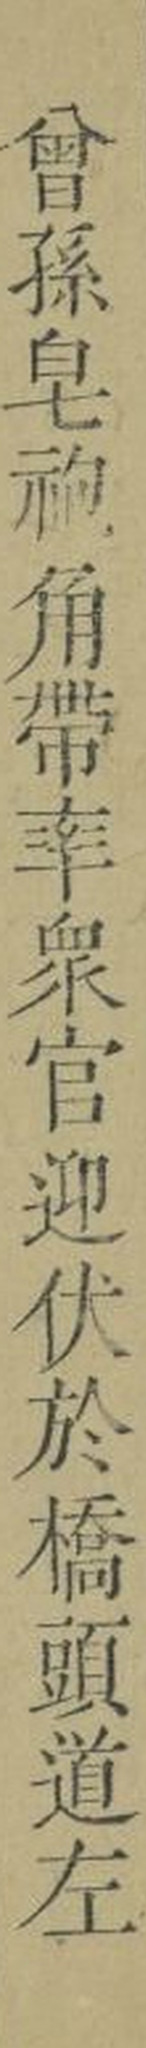曾孫皂袍角帶率衆官迎伏於橋頭道左
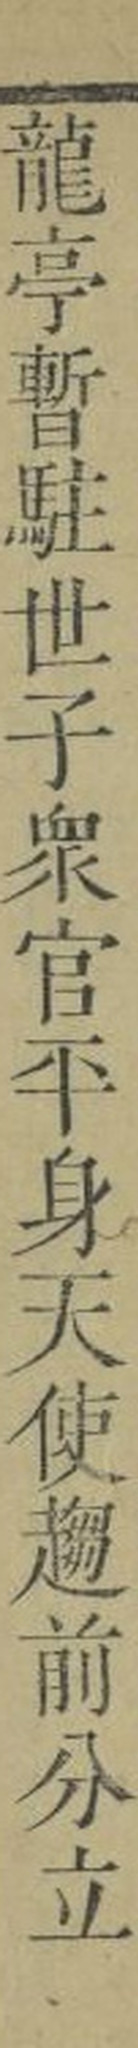龍亭暫駐世子衆官平身天使趨前分立
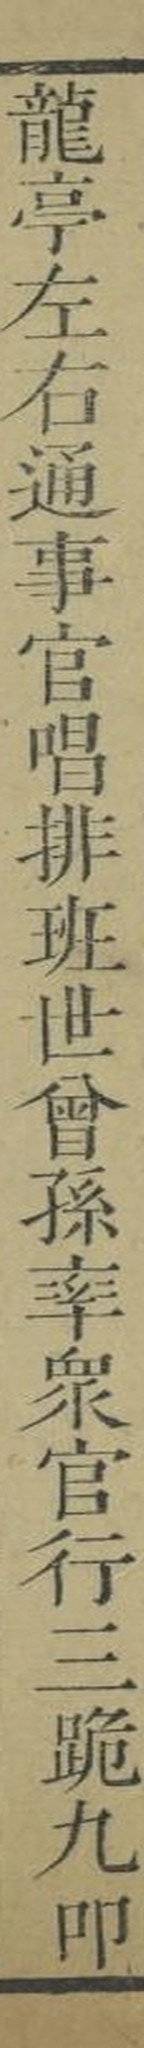龍亭左右通事官唱排班世曾孫率衆官行三跪九叩
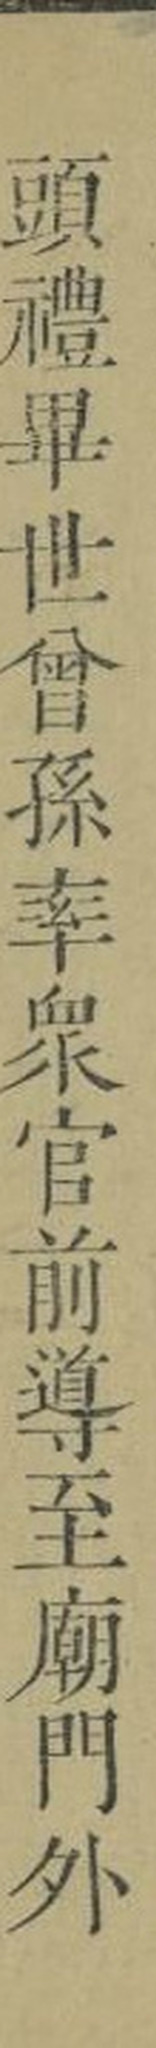頭禮畢世曾孫率衆官前導至廟門外
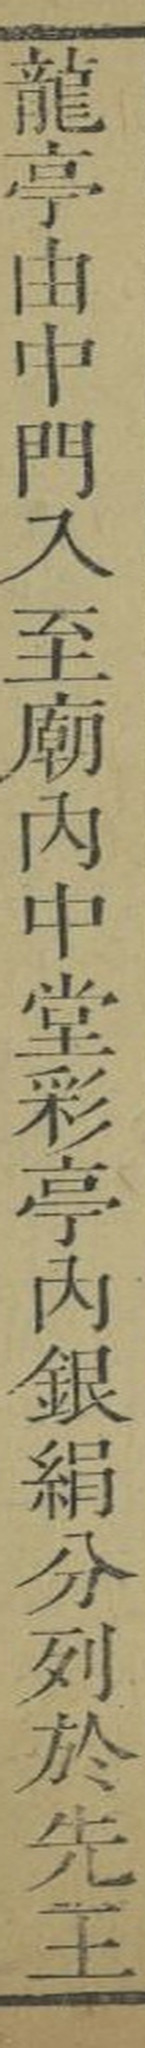龍亭由中門入至廟内中堂彩亭内銀絹分列於先王
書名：中山伝信録 巻二
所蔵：University of the Ryukyus Library
